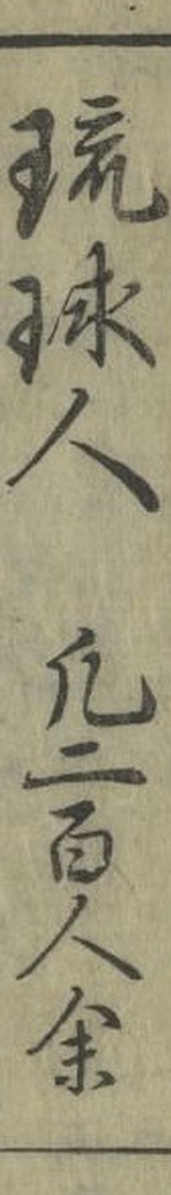琉球人凡二百人余
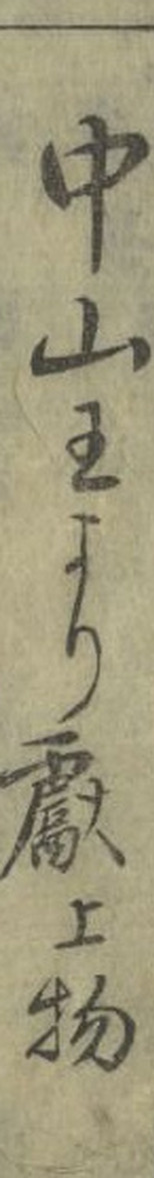中山王より獻上物
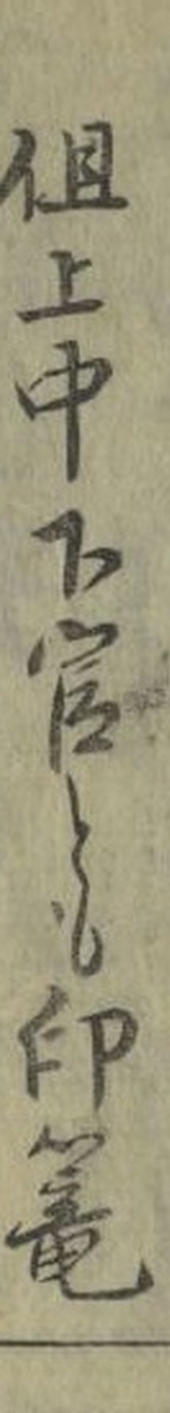但上中下官とも印篭
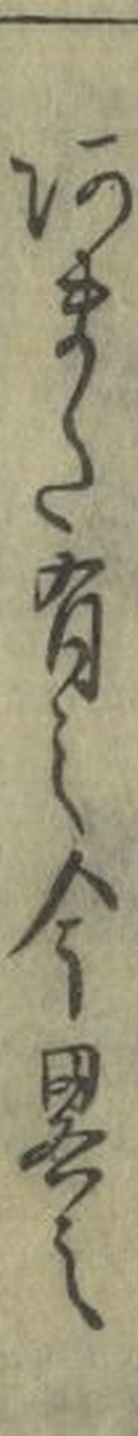あまた有之今略之
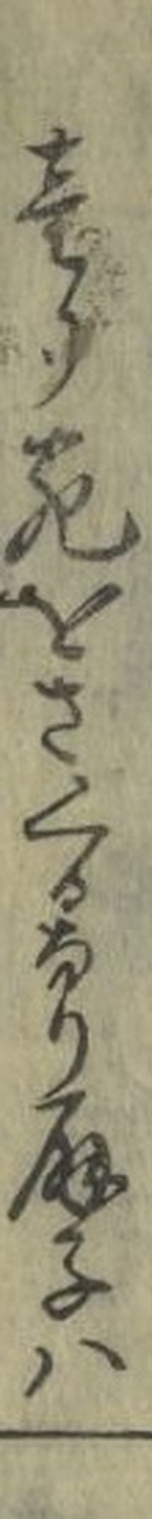壱つ宛をさくるなり辟子は
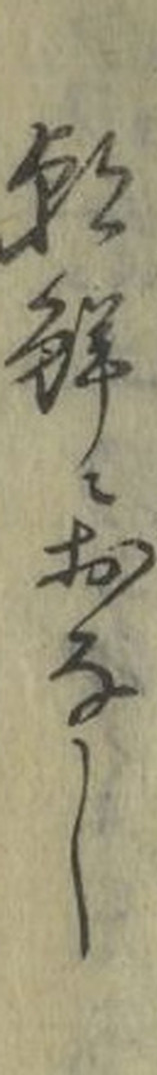朝鮮におなし
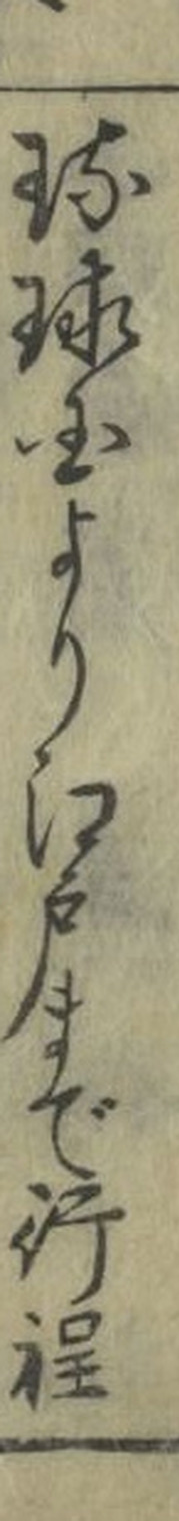琉球国より江戸まで行程
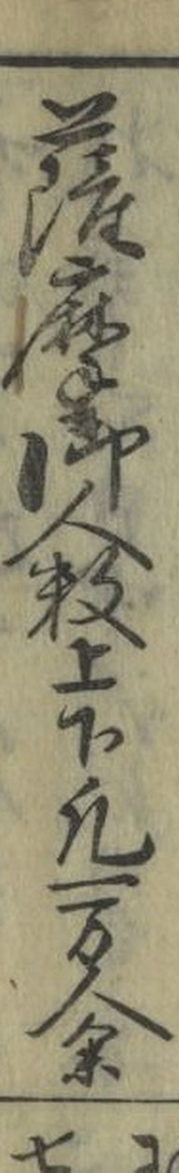薩摩御人数上下凡一万人余
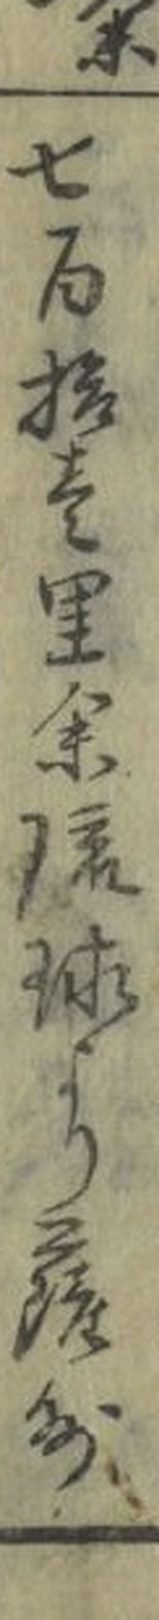七百拾壱里余琉球より薩州
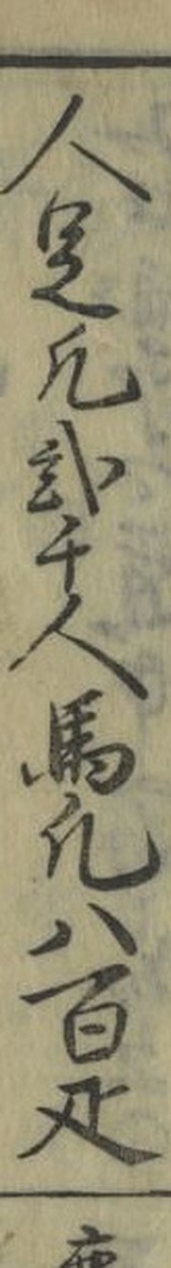人足凡弐千人馬凡八百疋
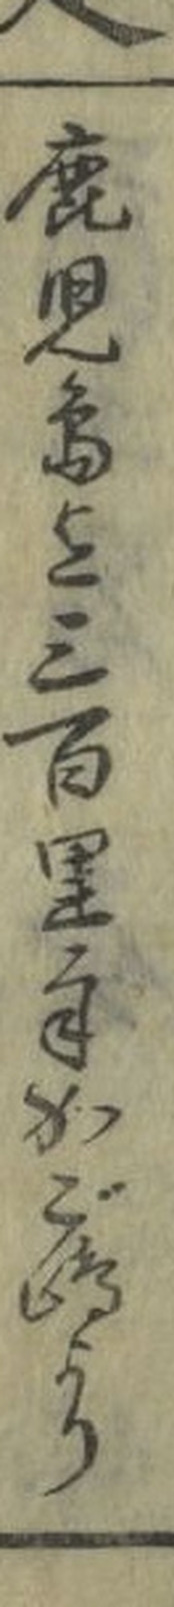鹿児島迄三百里余かご嶋より
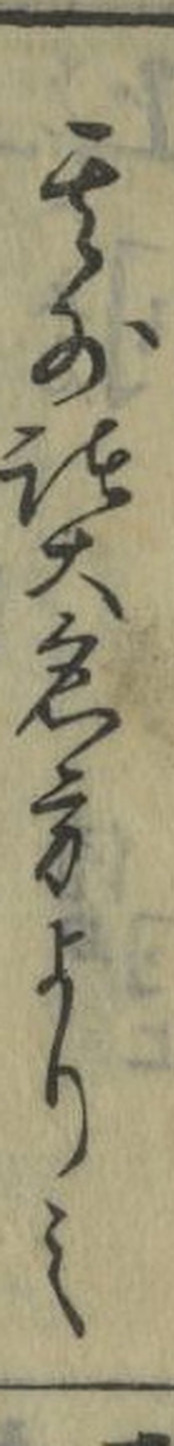其外諸大名方より之
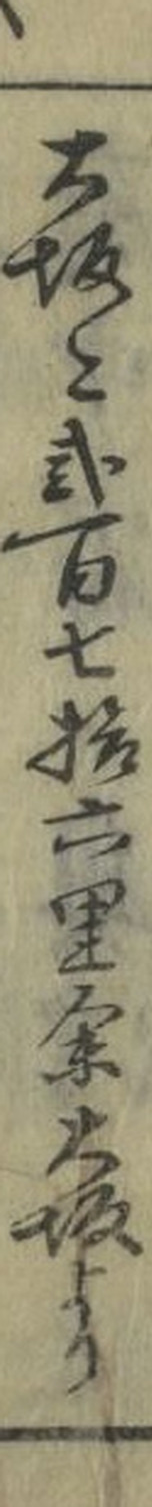大坂迄二百七拾六里余大坂より
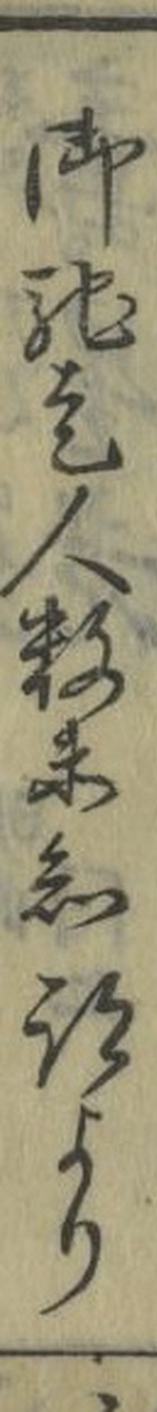御馳走人数未知跡より
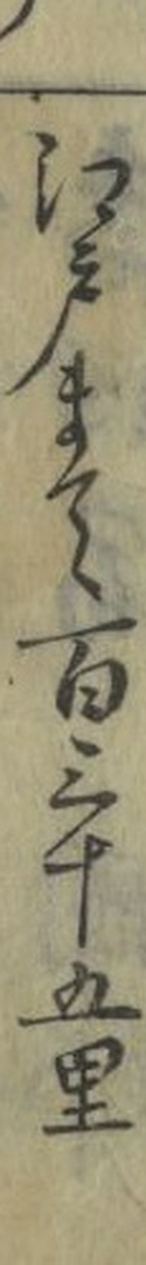江戸まて百三十五里
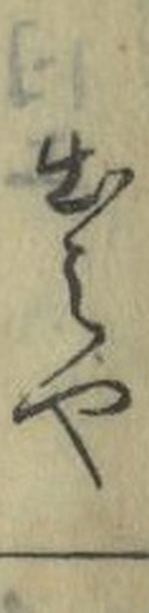出之也
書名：[琉球人行列記]
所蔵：University of the Ryukyus Library
